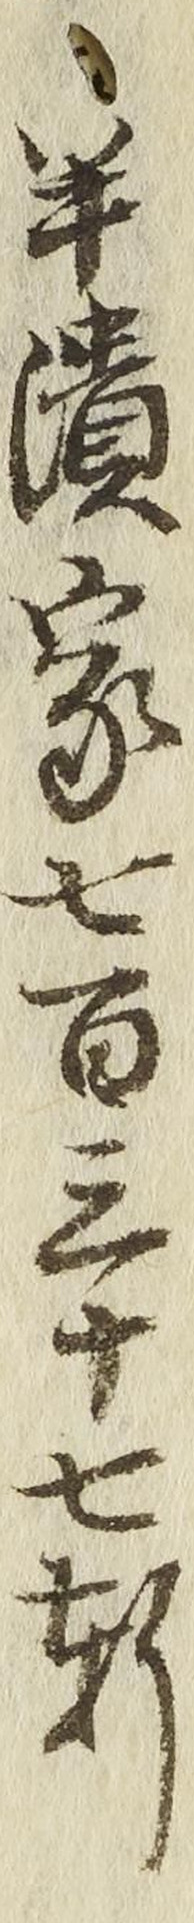半潰家七百三十七軒
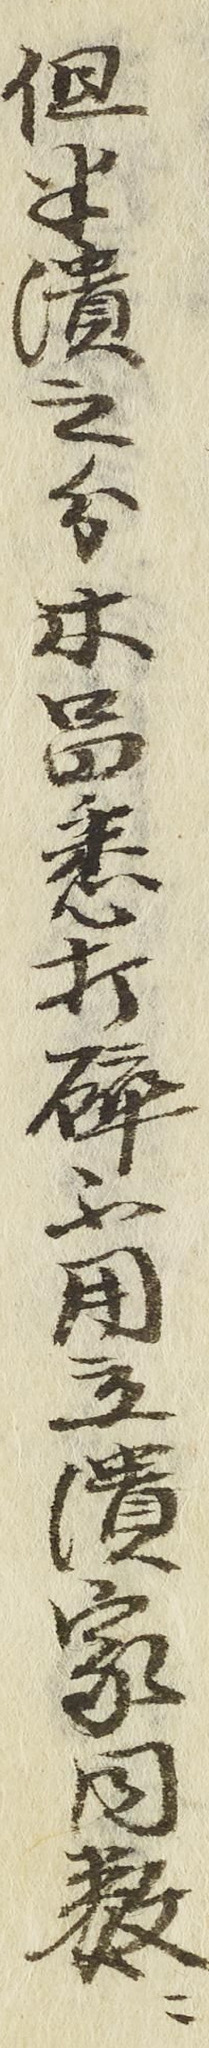但半潰之分木品悉打砕不用立潰家同数二
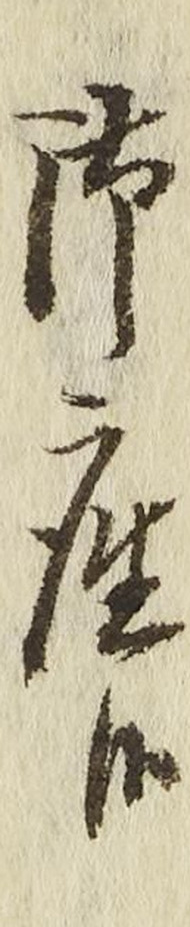御座候
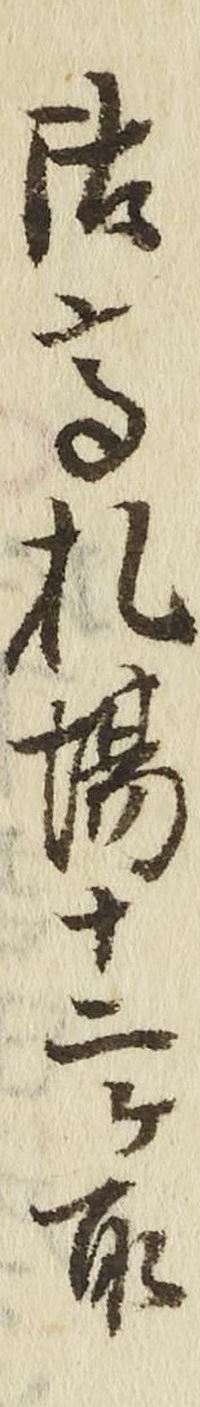御高札場十二ヶ所
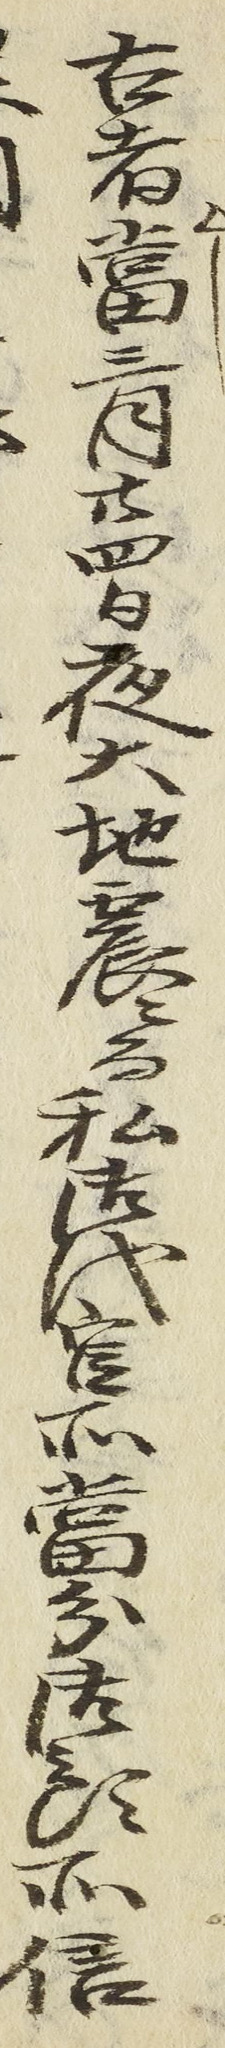右は当三月廿四日夜大地震二而私御代官所当分御預所信
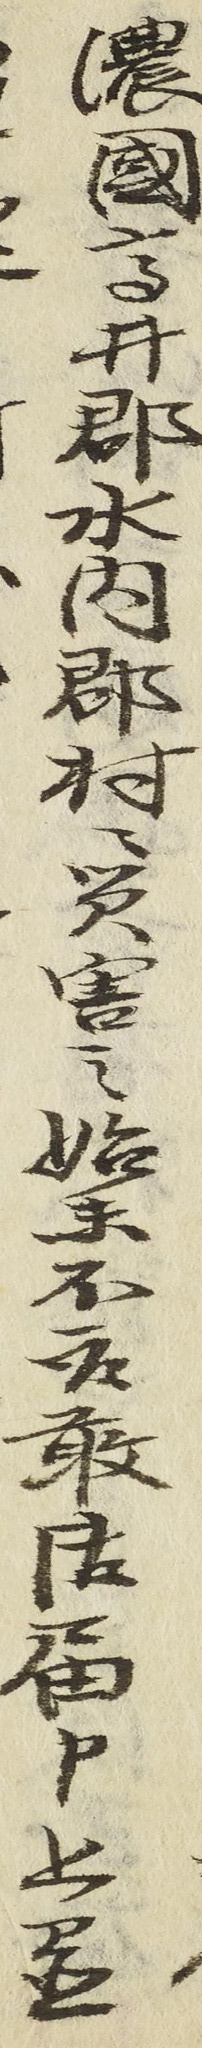濃国高井郡水内郡村々災害之始末不取敢御届申上置
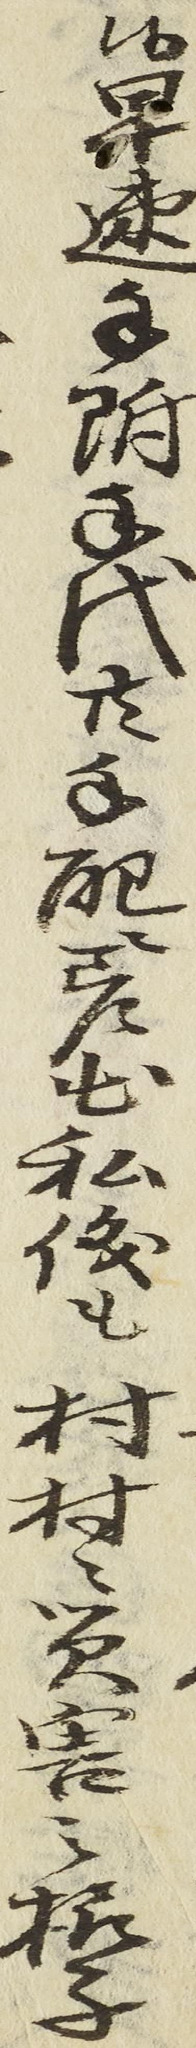候早速手附手代共手配二差出私儀も村村々災害之様子
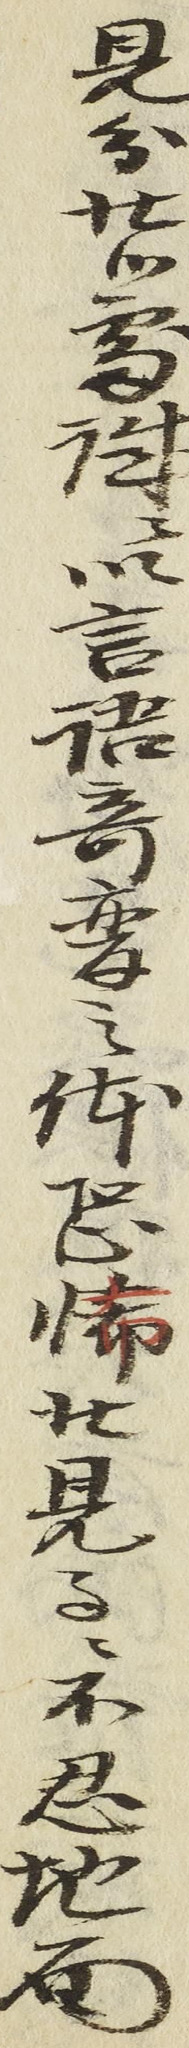見分仕候処誠二以言語奇変之体恐怖仕見る二不忍地面
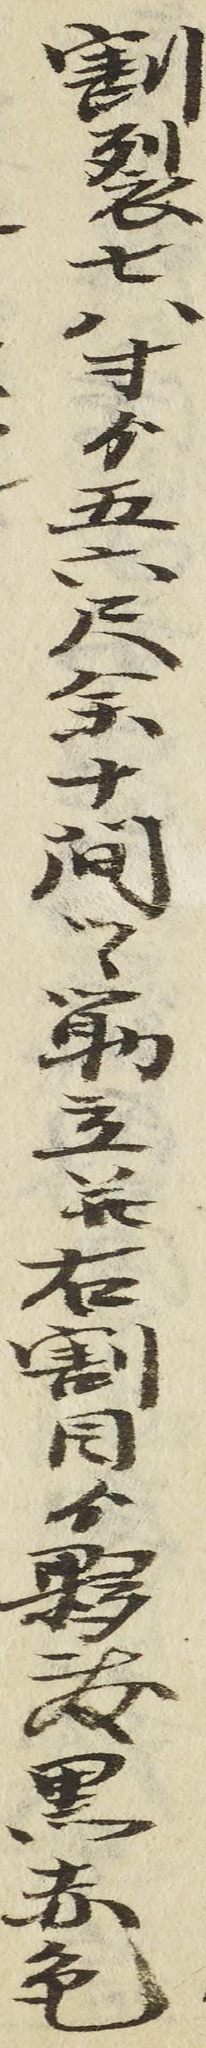割裂七八寸ゟ五六尺余十間ツ筋立并右割目ゟ夥敷黒赤色
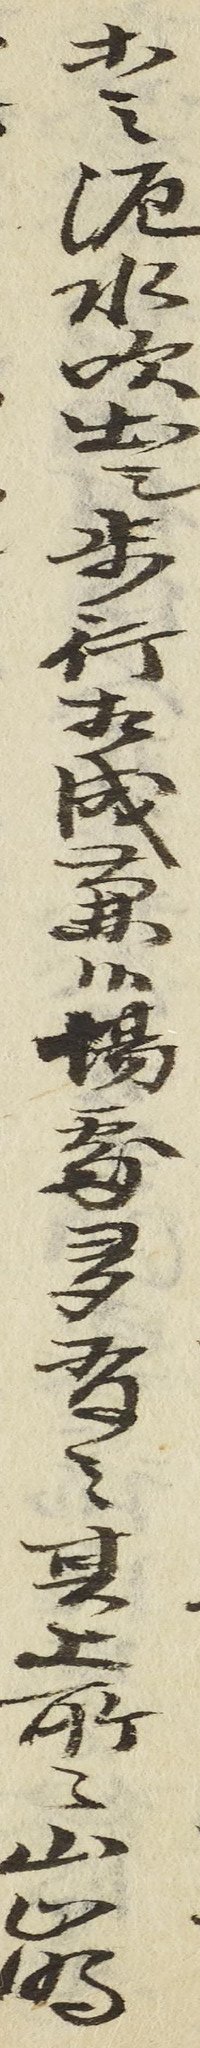等之泥水吹出シ歩行相成兼候場処多有之其上所々山崩
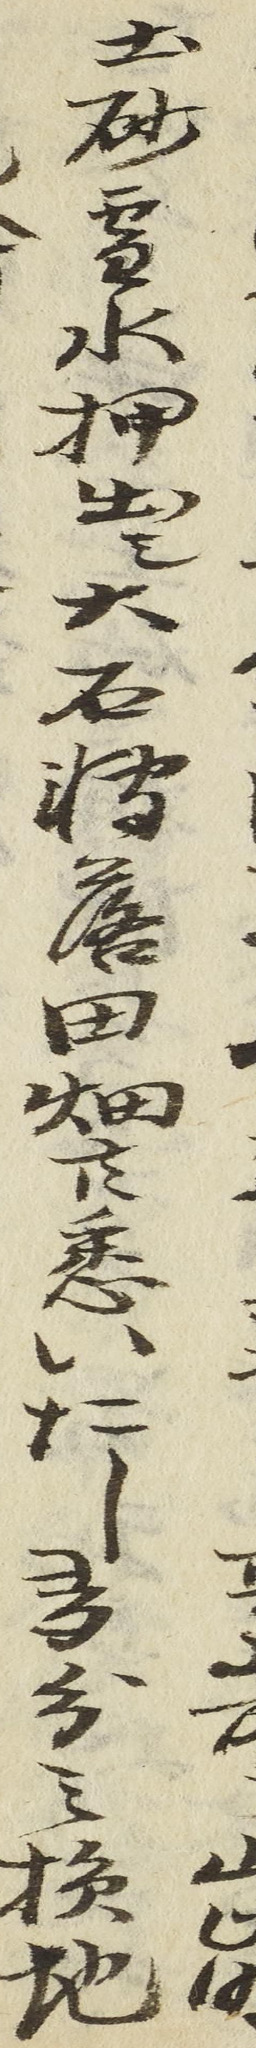土砂雪水押出ㇱ大石転落田畑共悉いたし多分之損地
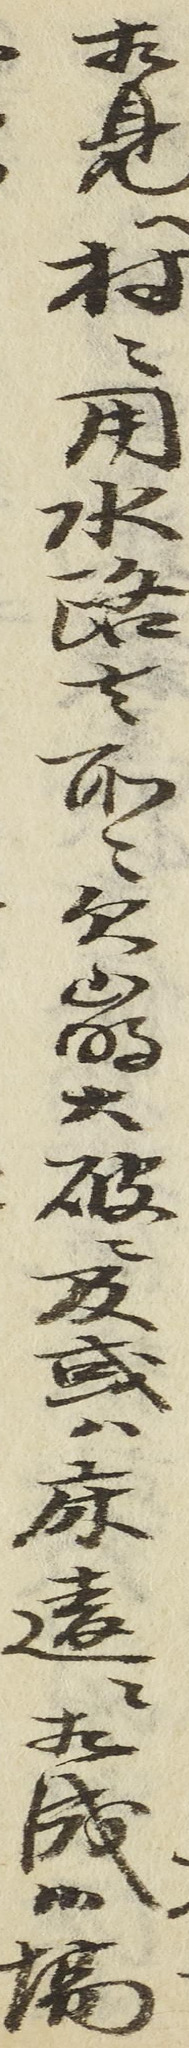相見へ村々用水路は所々欠崩大破二及或ハ床違二相成候場
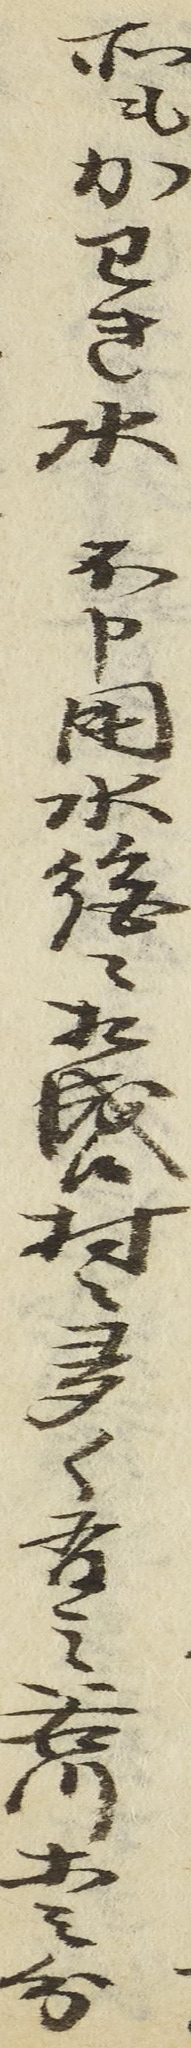所もかわき水不申用水絶二相成候村々多く有之谷川等之分
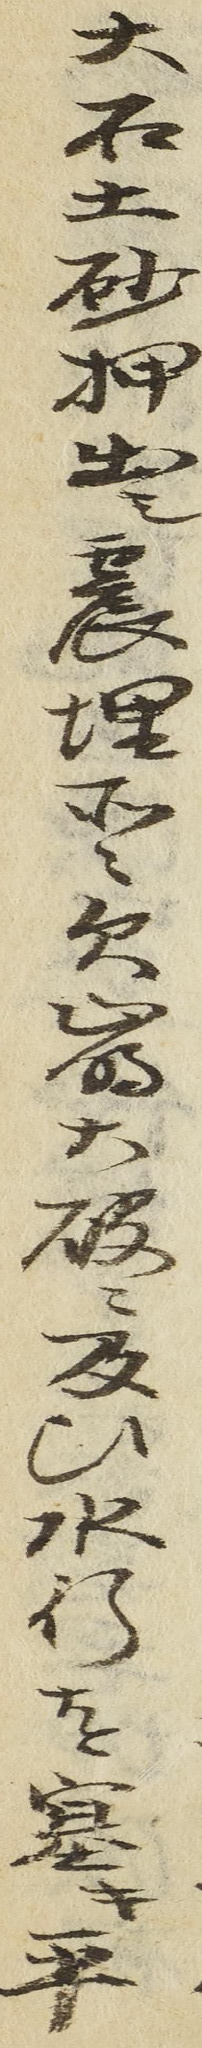大石土砂押出ㇱ震埋所々欠崩大破二及ひ水行を塞キ平

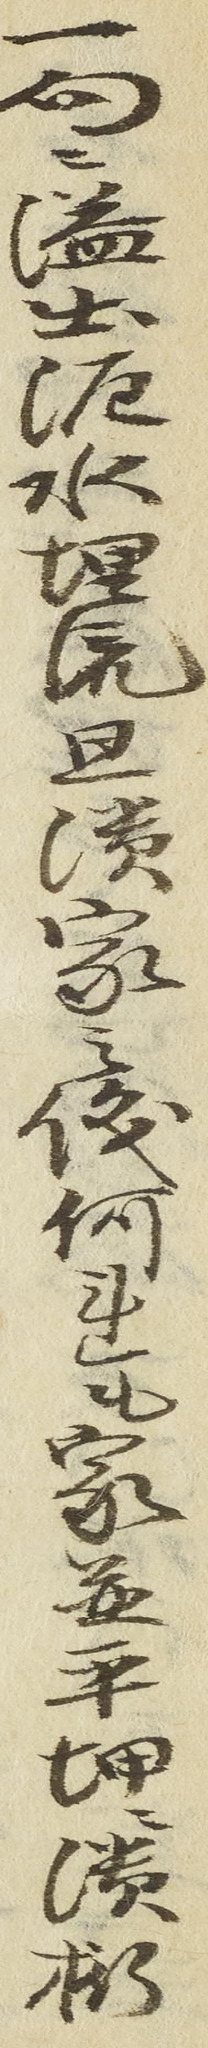一旬二溢出泥水埋流且潰家之儀何れも家並平押二潰桁
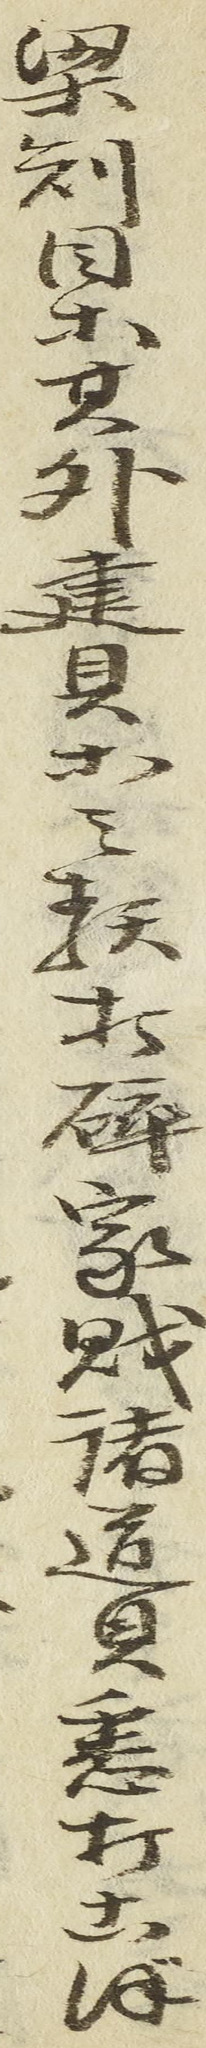梁矧目其外建具等之類打砕家財諸道具悉打こほ
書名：信濃國大地震記　乾
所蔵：東京大学地震研究所図書室 Earthquake Research Institute Library, The University of Tokyo, JAPAN
